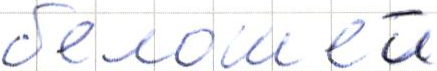белошей
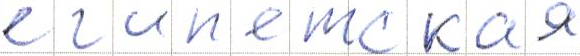египетская
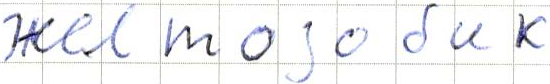желтозобик
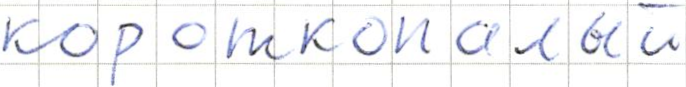короткопалый
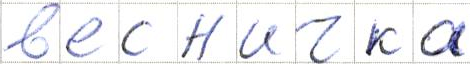весничка
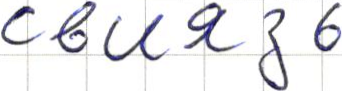свиязь
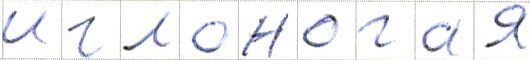иглоногая
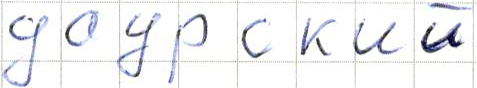даурский
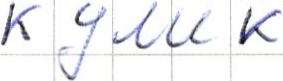кулик
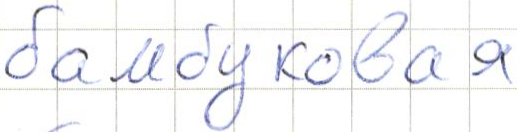бамбуковая
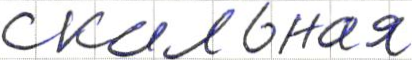скальная
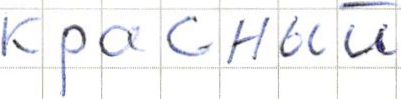красный
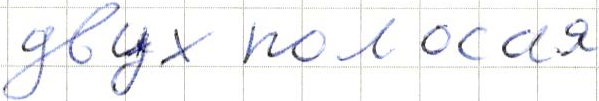двухполосая
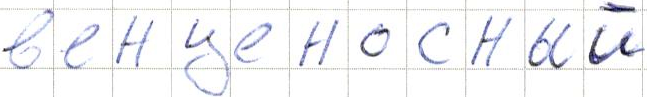венценосный
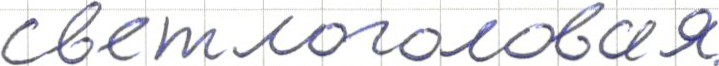светлоголовая
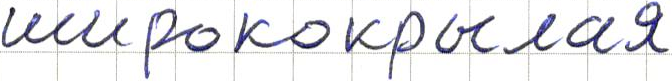ширококрылая
